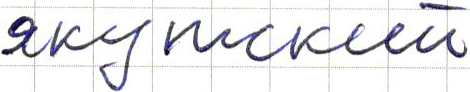якутский
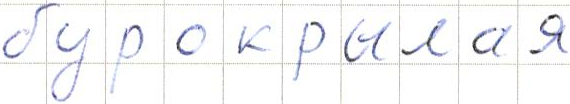бурокрылая
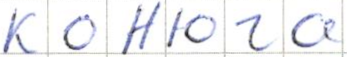конюга
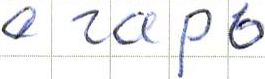огарь
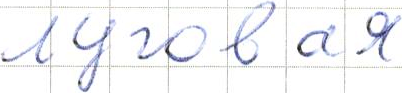луговая
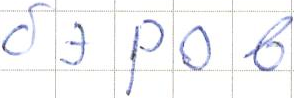бэров
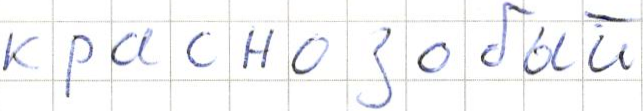краснозобый
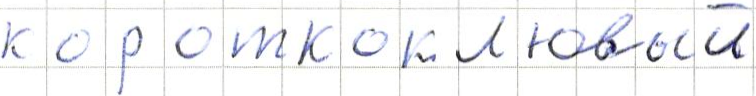короткоклювый
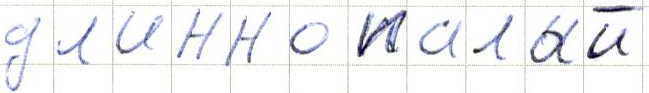длиннопалый
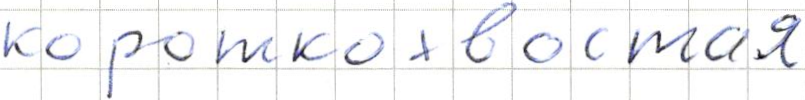короткохвостая
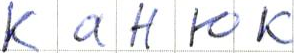канюк
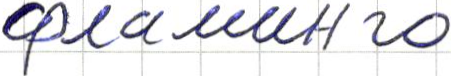фламинго
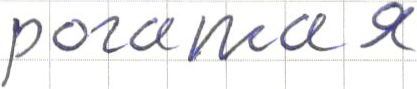рогатая
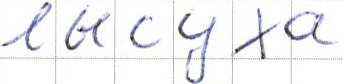лысуха
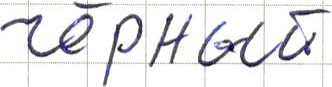чёрный
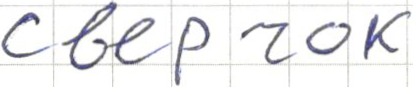сверчок
